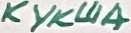кукша
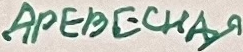древесная
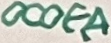осоед
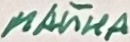майна
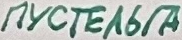пустельга
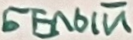белый
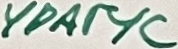урагус
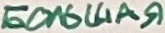большая
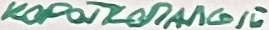короткопалый
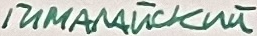гималайский
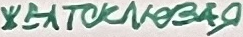желтоклювая
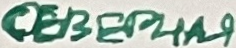северная
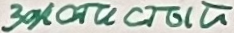золотистый
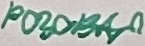розовая
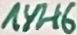лунь
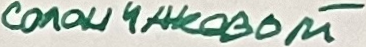солончаковый
